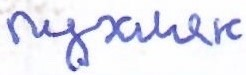пухляк
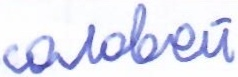соловей
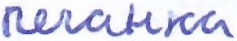пеганка
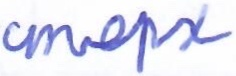стерх
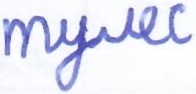тулес
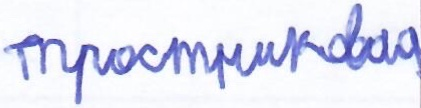тростниковая
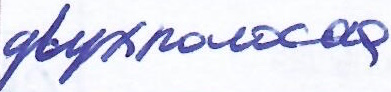двухполосая
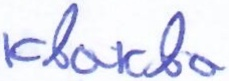кваква
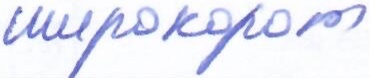широкорот
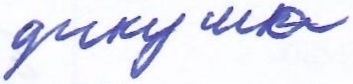дикуша
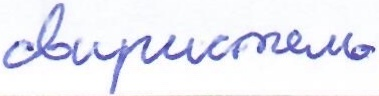свиристель
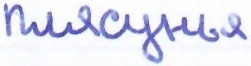плясунья
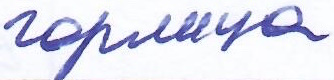горлица
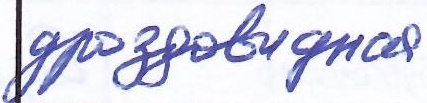дроздовидная
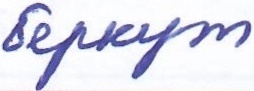беркут
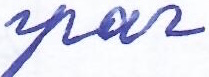грач
